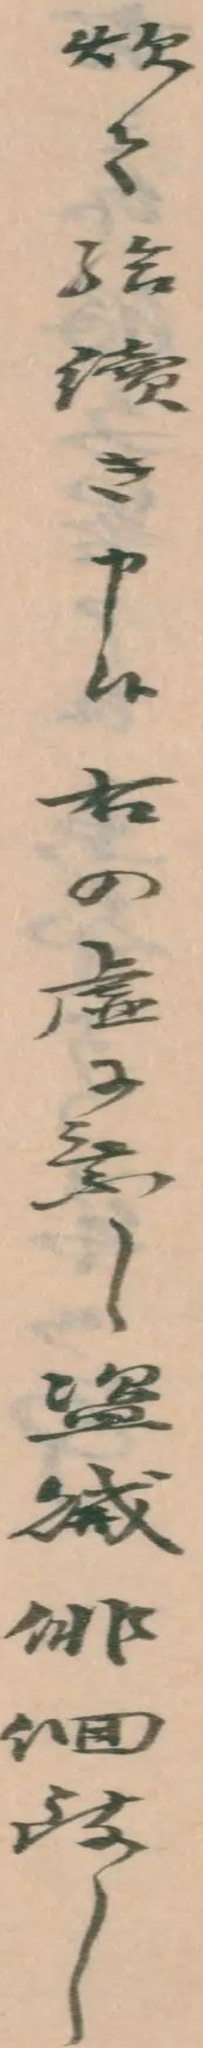炊て給続き申候右之虚に乗し盗賊徘徊致し
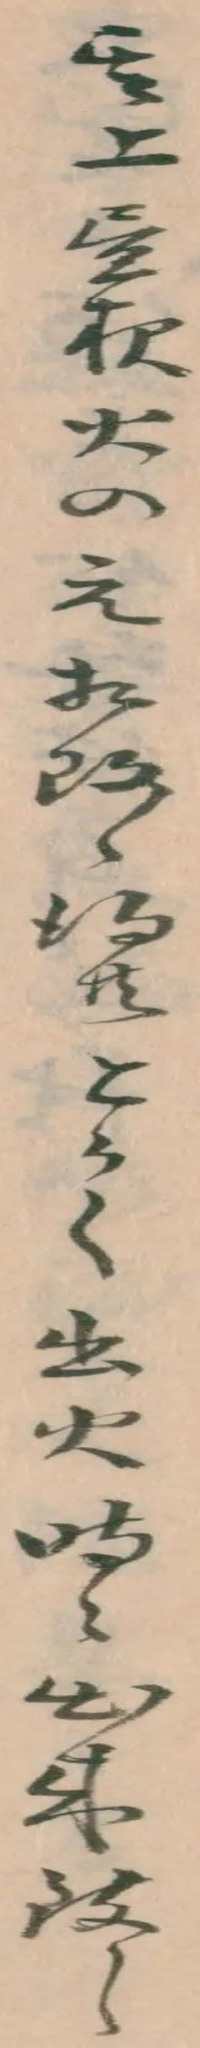其上昼夜火の元相改候得共とう〳〵出火時々出来致し
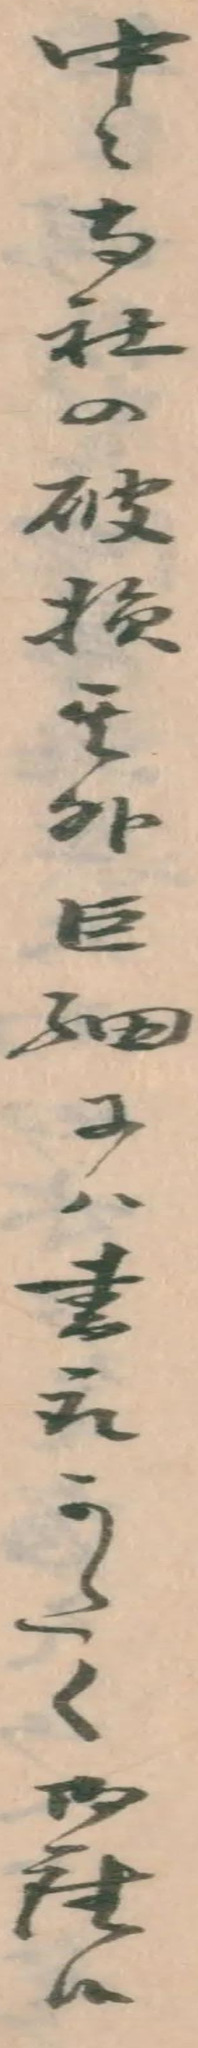中々寺社の破損其外巨細にハ書取かたく御座候
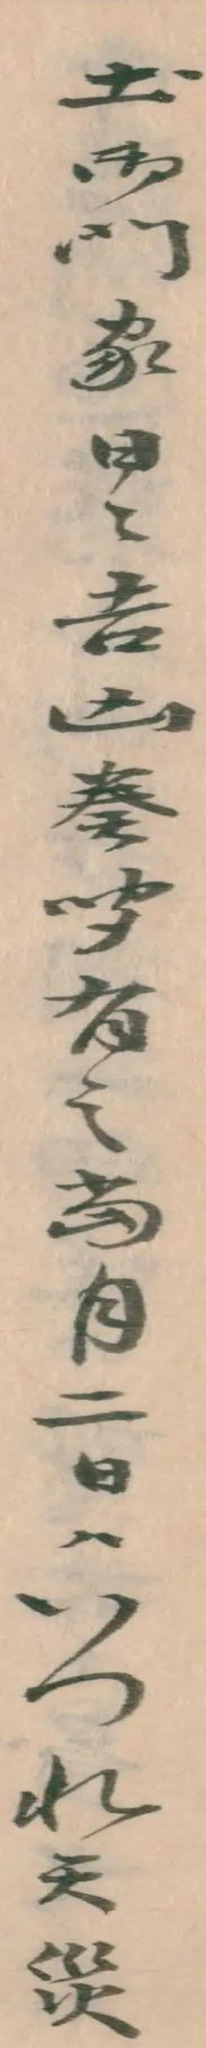一土御門家日々吉凶奏聞有之当月二日ハいつれ天災
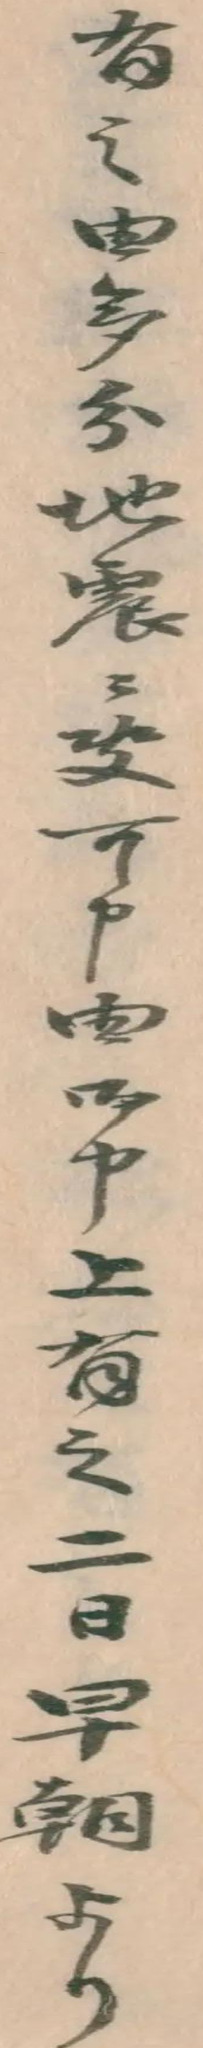有之由多分地震二決可申由御申上有之二日早朝より
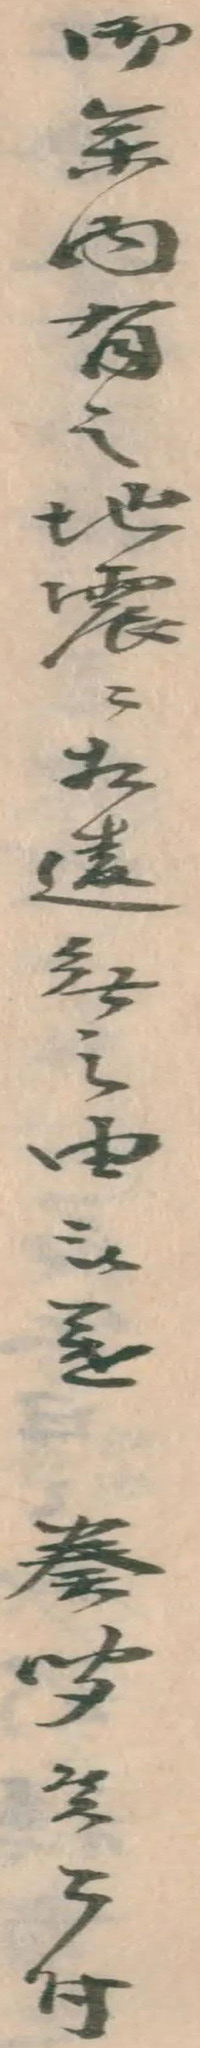御参内有之地震二相違無之由被達奏聞候二付
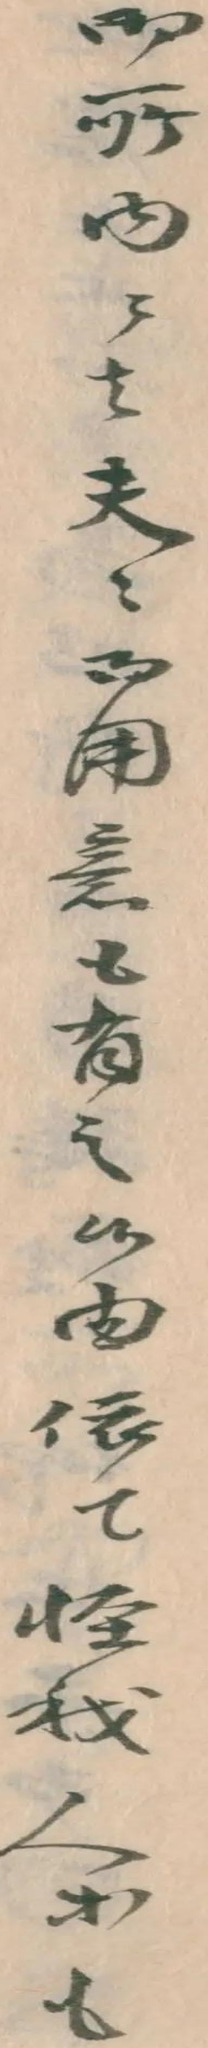御所内二も夫々御用意も有之候由依て怪我人等も
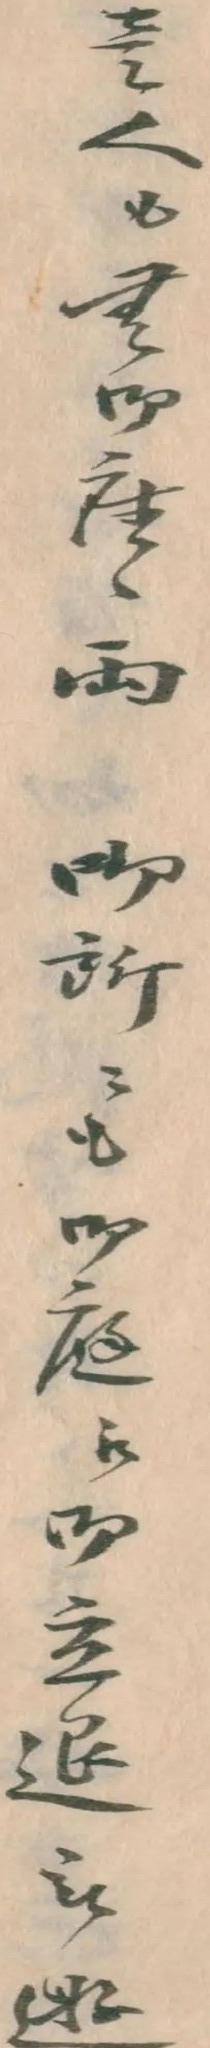壱人も無御座候両御所二も御庭江御立退被遊
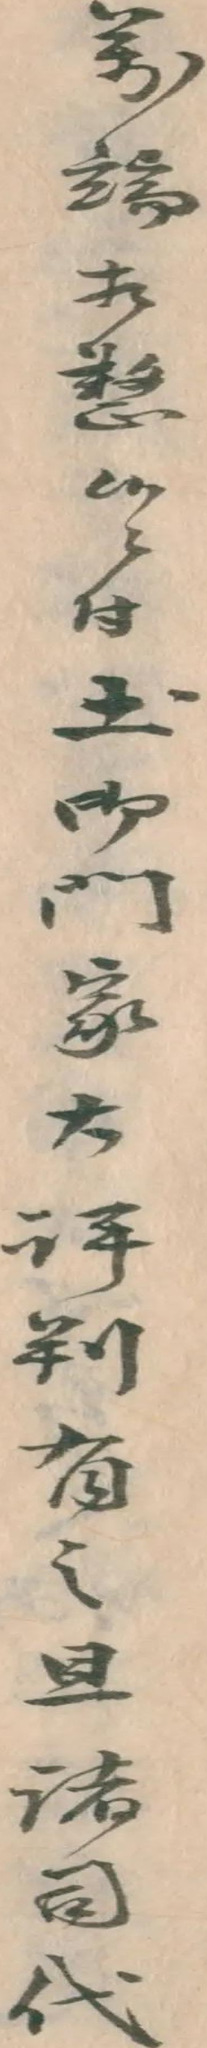万端相整候二付土御門家大評判有之且諸司代
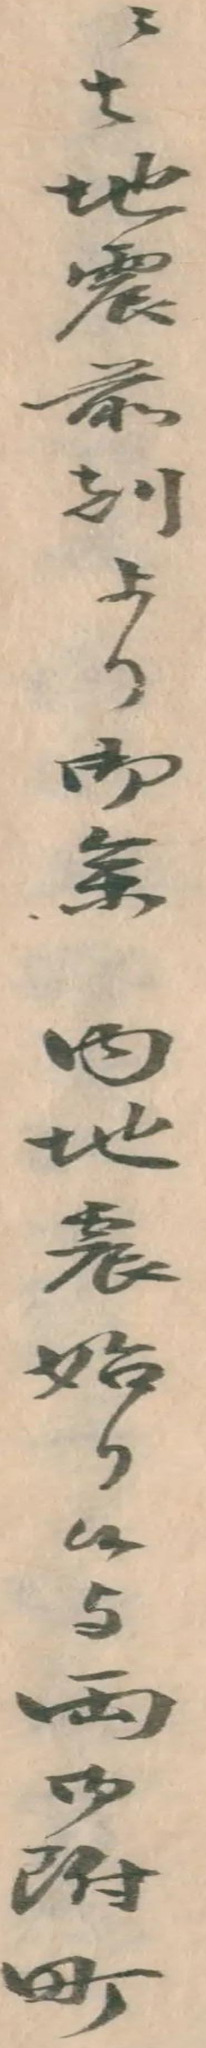二者地震前刻より御参内地震始り候と両御附町

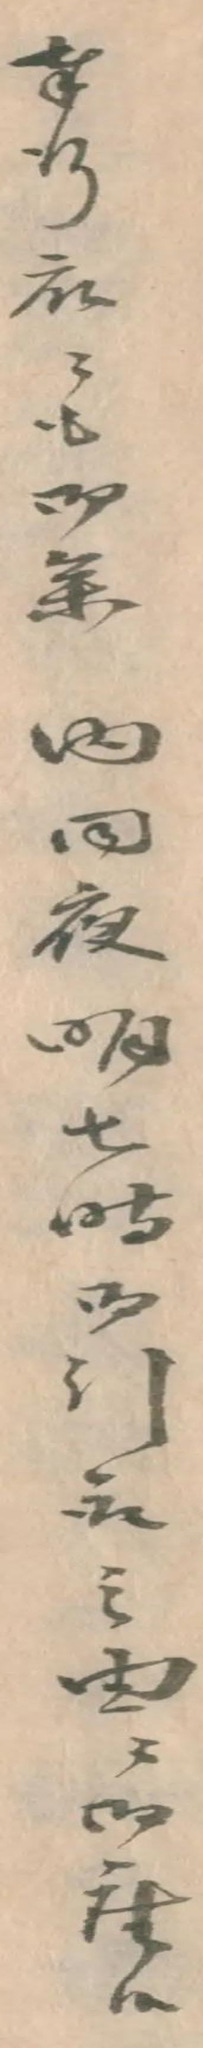奉行衆二も御参内同夜明七時御引取之由御座候
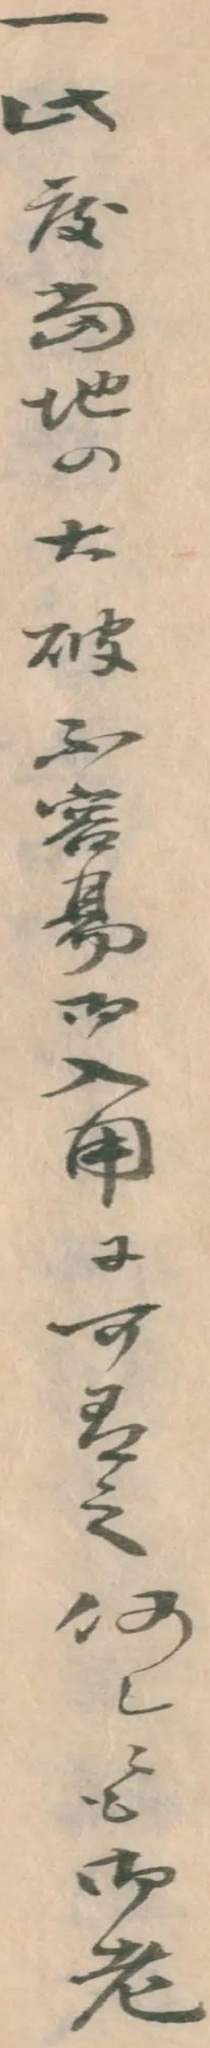一此度当地の大破不用易御入用に可有之何レ二も御老
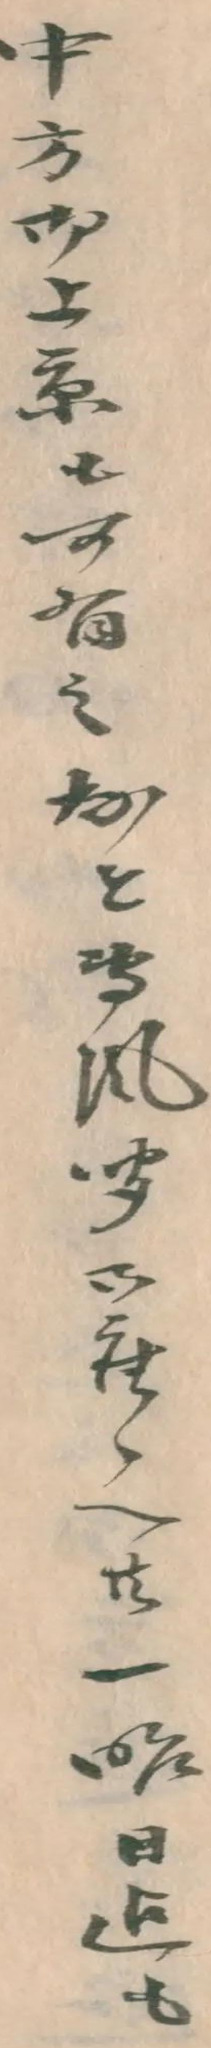中方御上京も可有之なとと風聞御座候へ共一昨日迄も
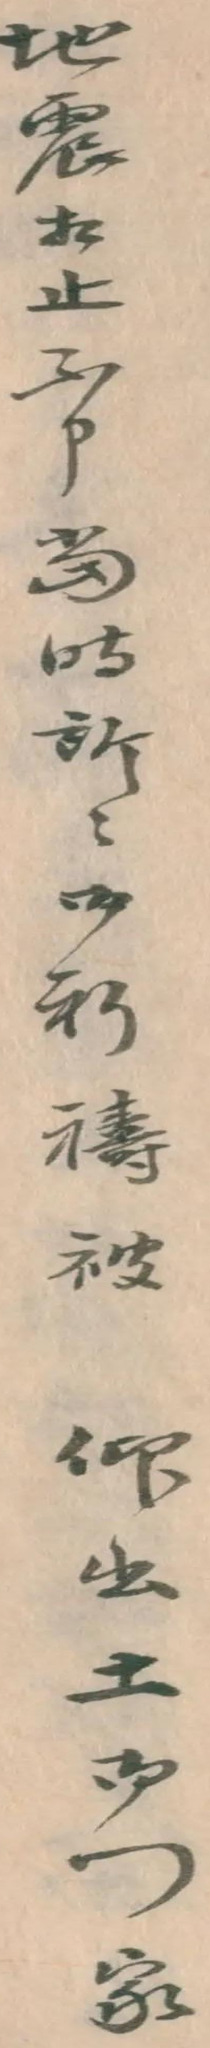地震相止不申当時所々御祈祷被仰出土御門家
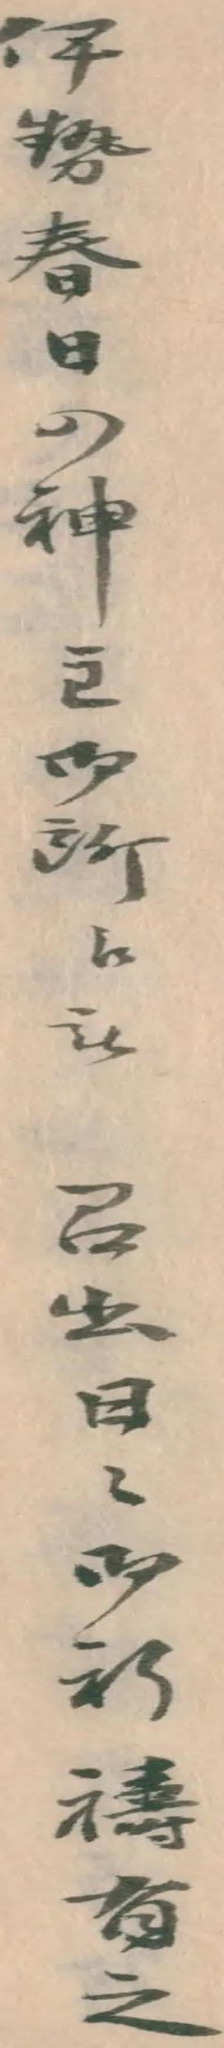伊勢春日の神主御所江被召出日々御祈祷有之
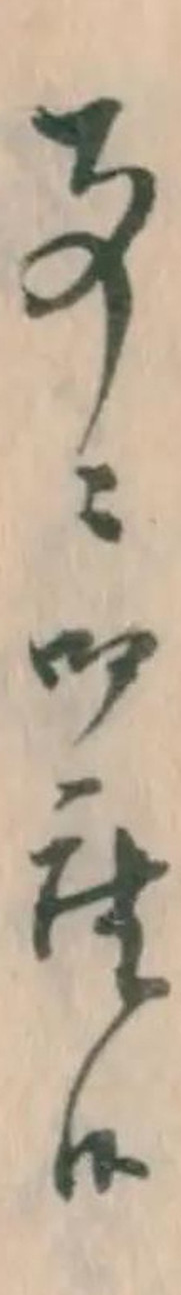事二御座候
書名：京都地震
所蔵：国立国会図書館 National Diet Library, JAPAN
